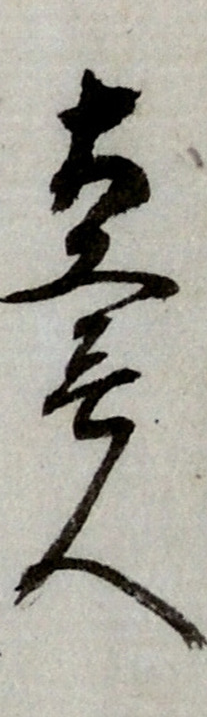大工壱人
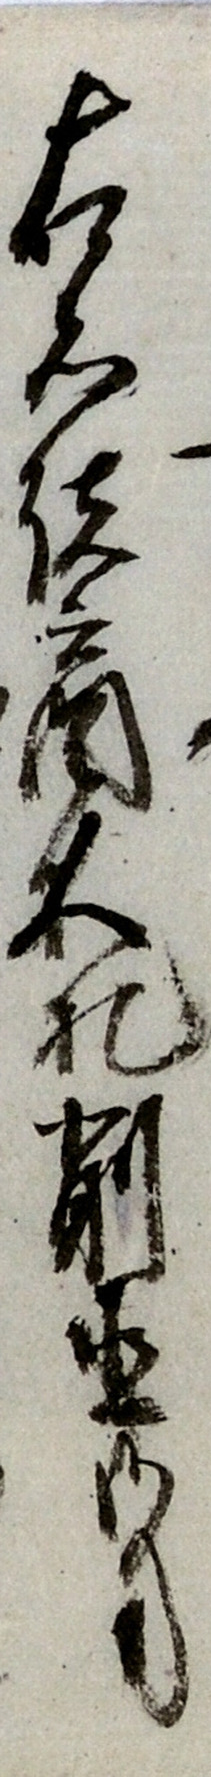右は諸商人札削直御用
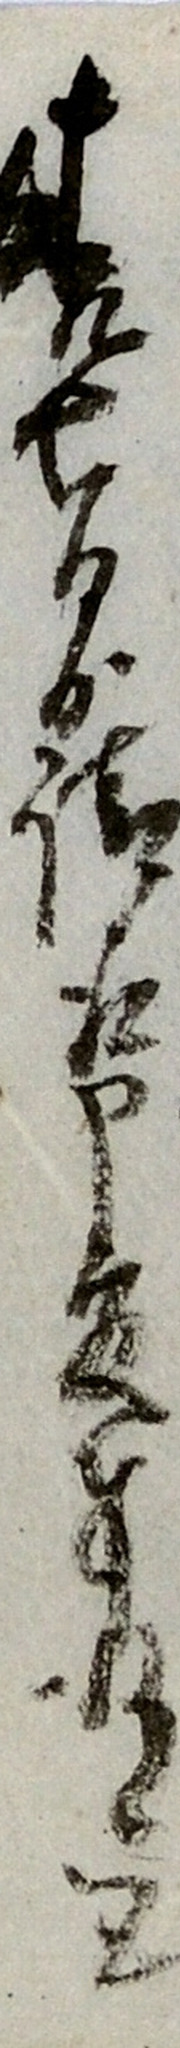来ル七日ゟ請取申度奉存候以上
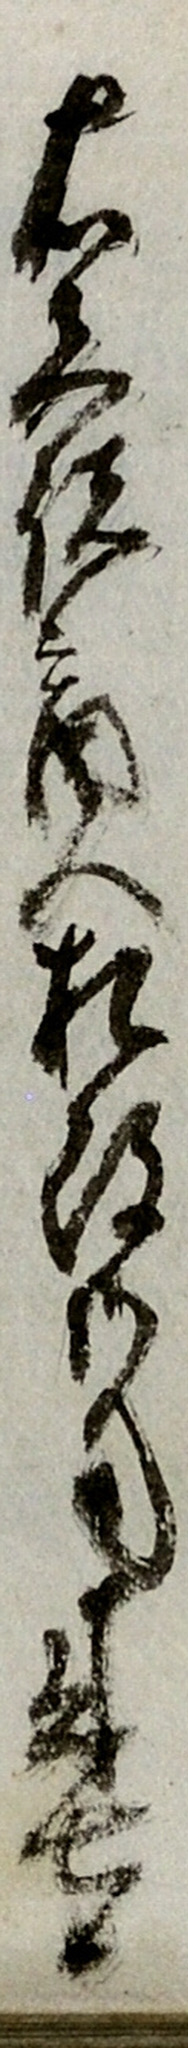右は諸商人札改御用来七日
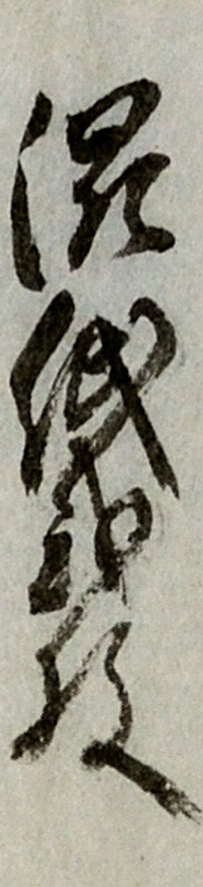渋紙弐枚
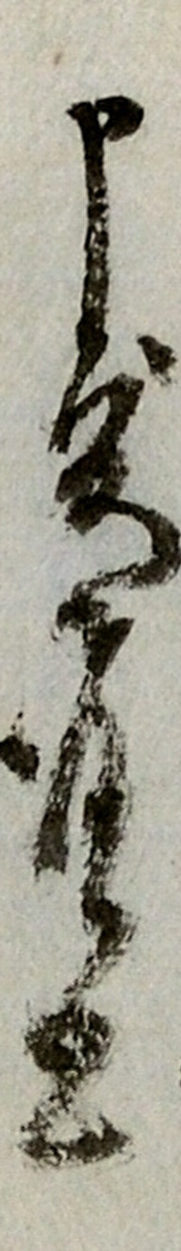申度奉存候以上
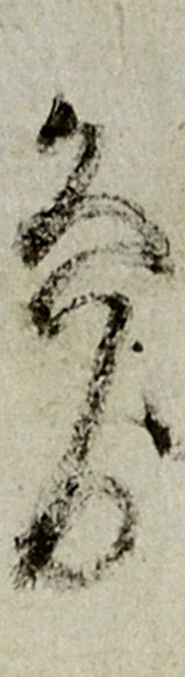弥右衛門
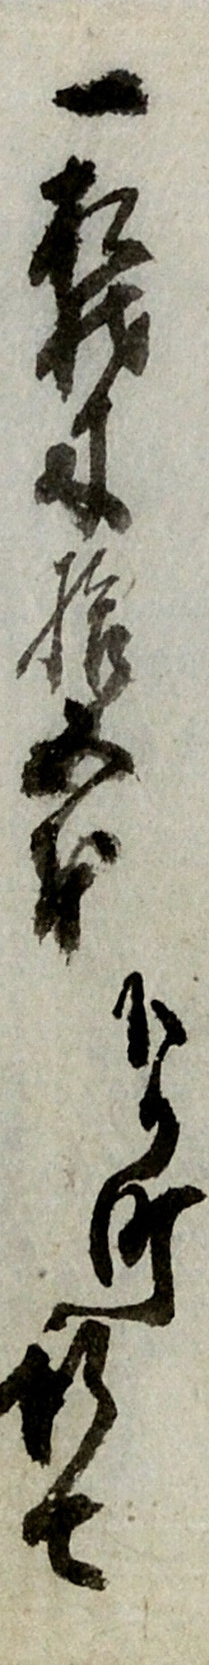一松材木拾五本下り町新七
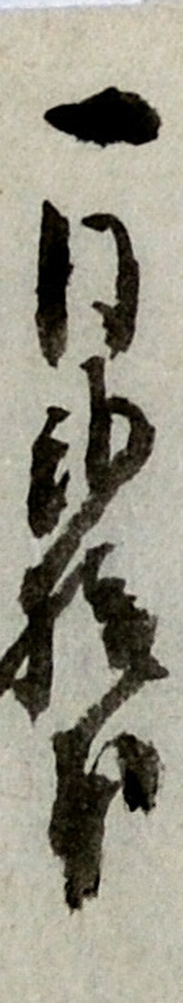一同弐拾本本町
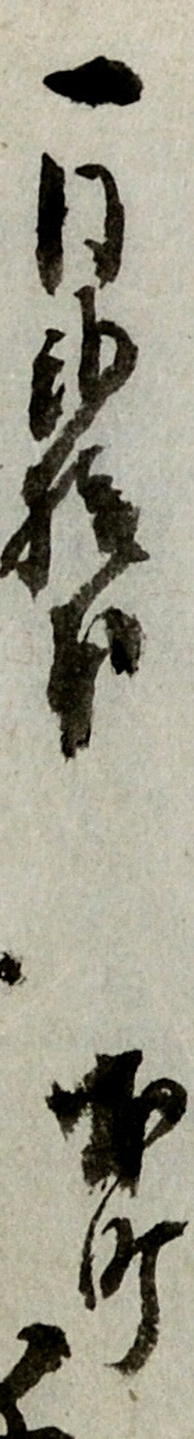一同弐拾本本町
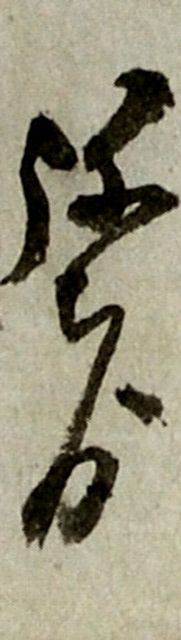弥右衛門
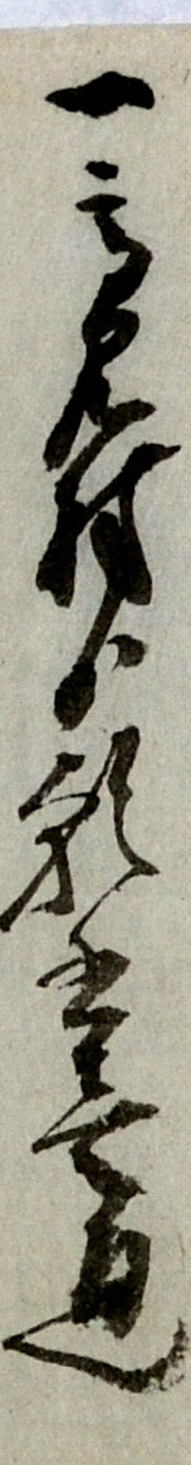一高見村ゟ願書壱通
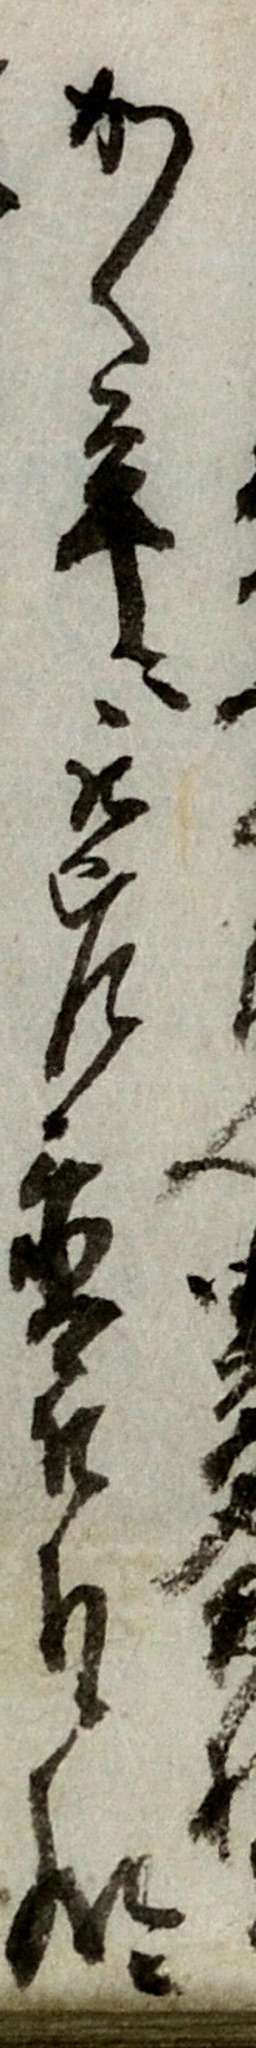かく年ニ被差置被下候様ニ
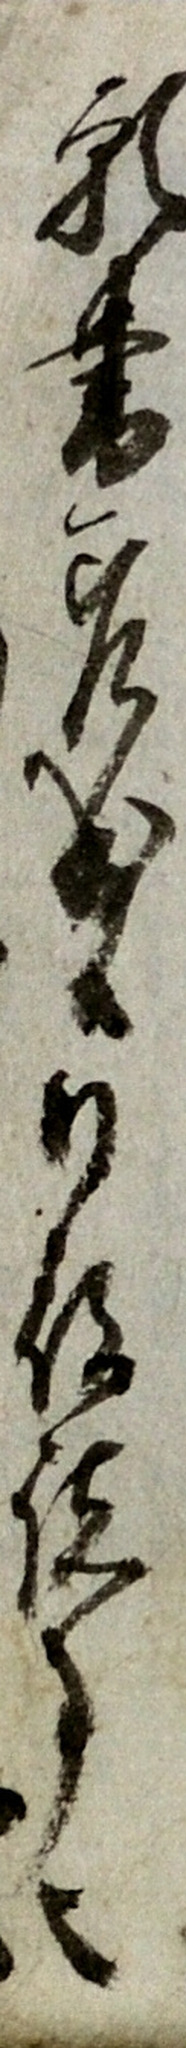願書差出候同役諸事申
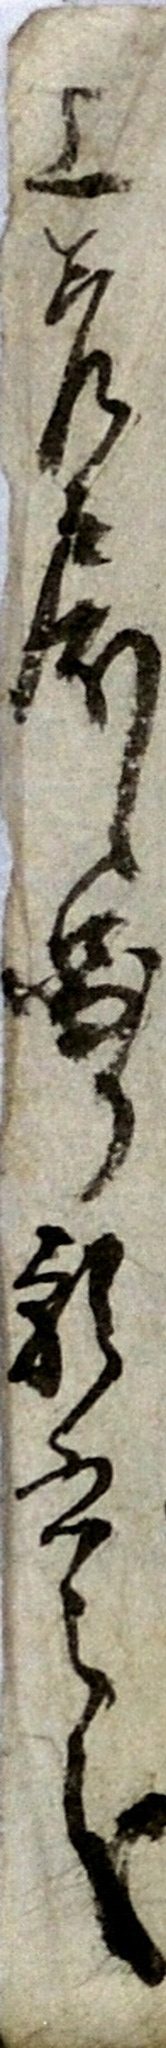上差戻候図り願書之義

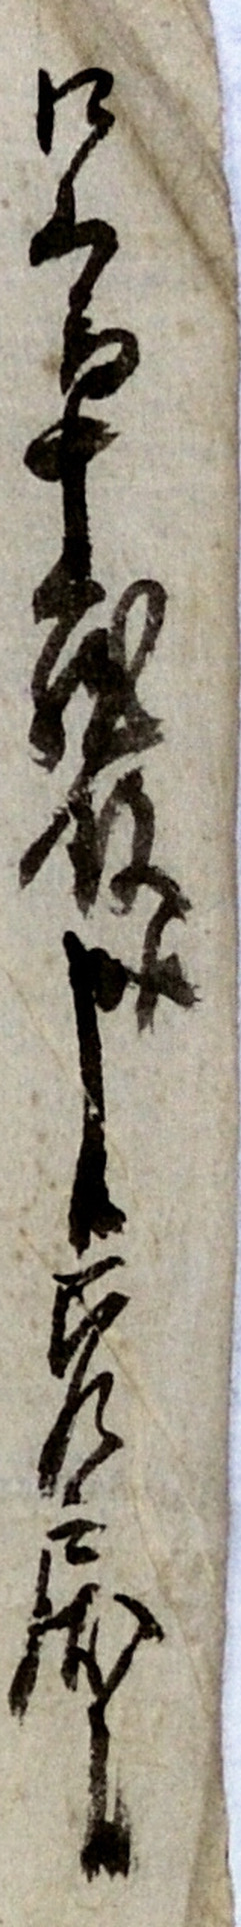口上ニ而十蔵江申上差戻候
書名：分一方諸事御用留帳
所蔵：伊那市立高遠町図書館・合同会社AMANE
